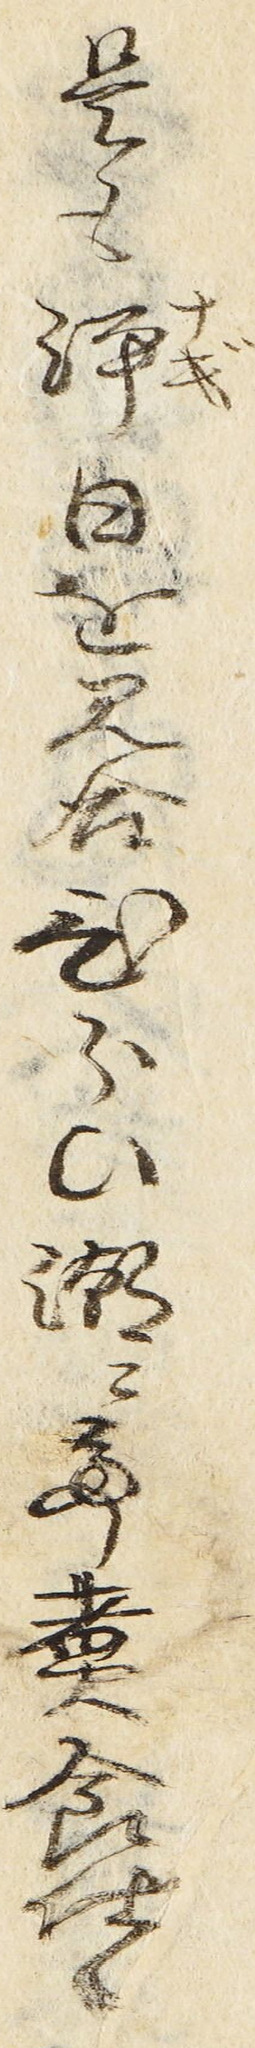是も泙日を見合ひらひ潮ニて煮食仕候
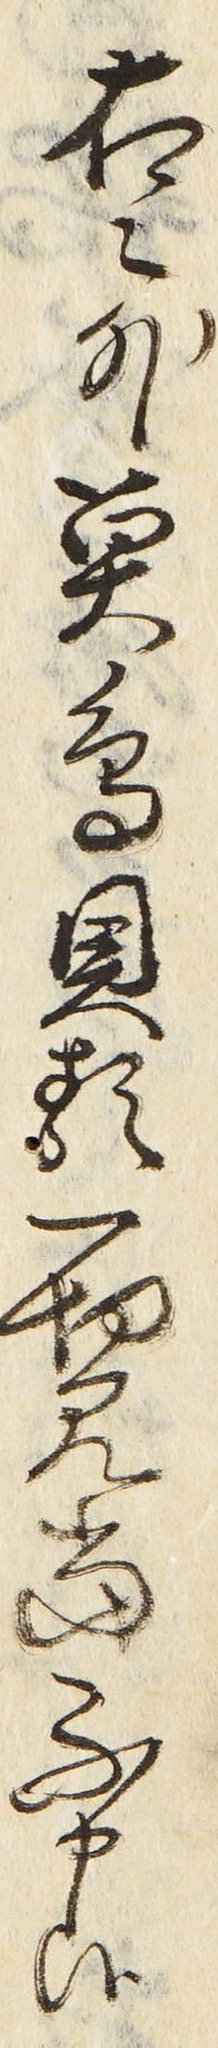右之外魚鳥貝類一切見当不申候
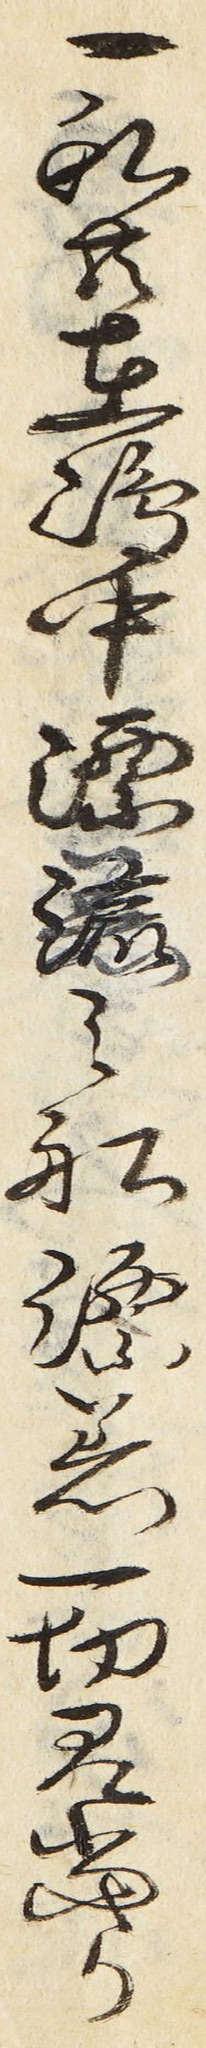一私共在嶋中漂流之船漂着一切見当り
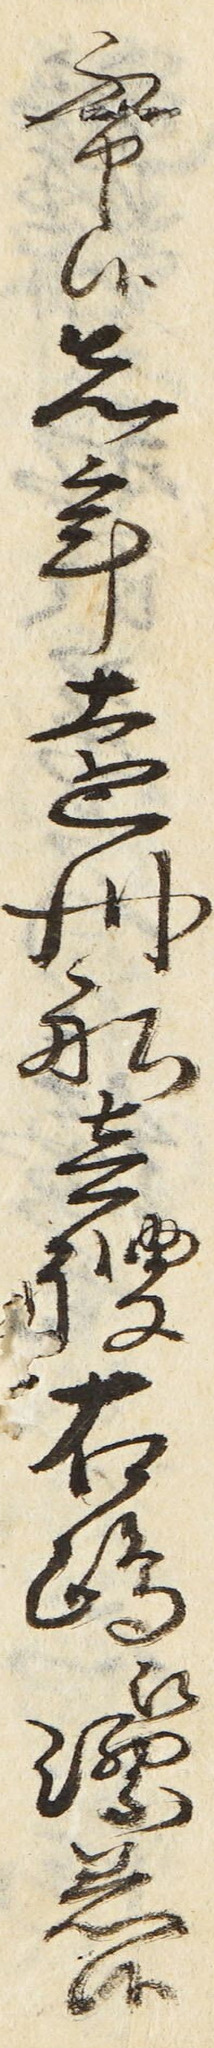不申候先年遠州船壱艘右嶋江漂着候
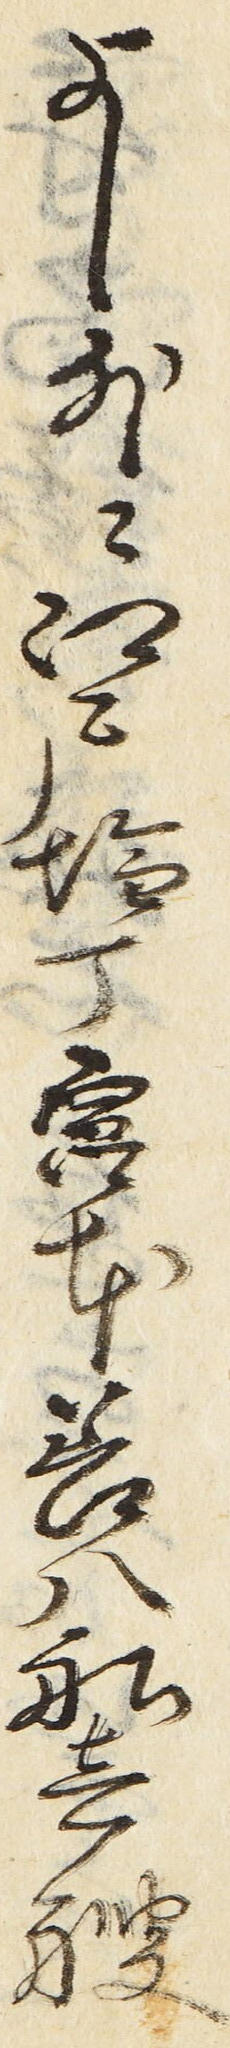よし外ニ江戸塩町富本善八船壱艘
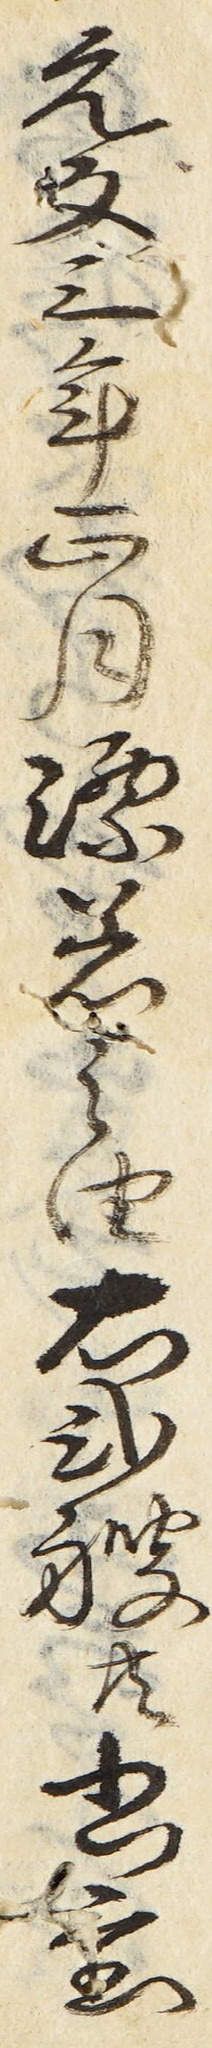元文三年正月漂着之由右弐艘共書置
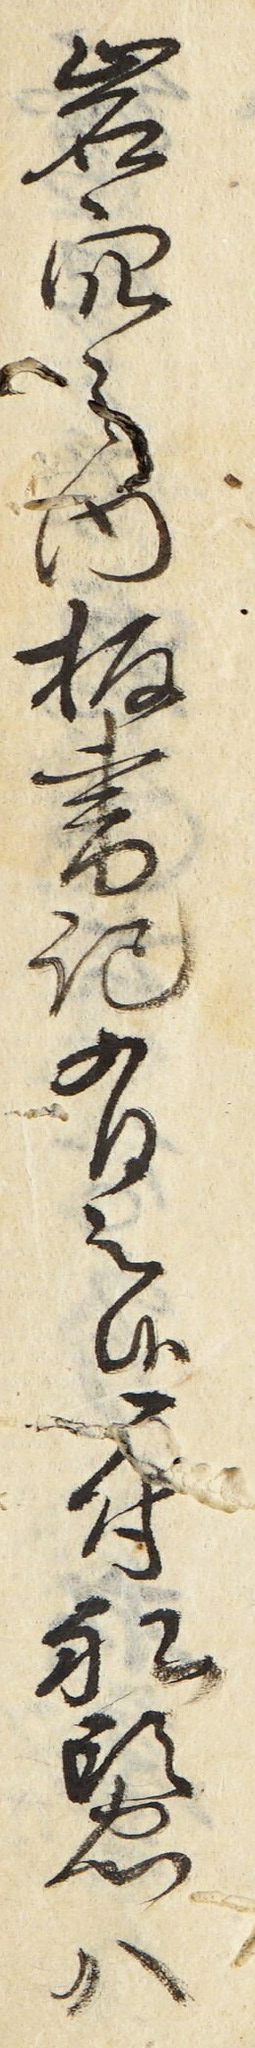岩穴之内板書記有之候ニ付船頭忠八

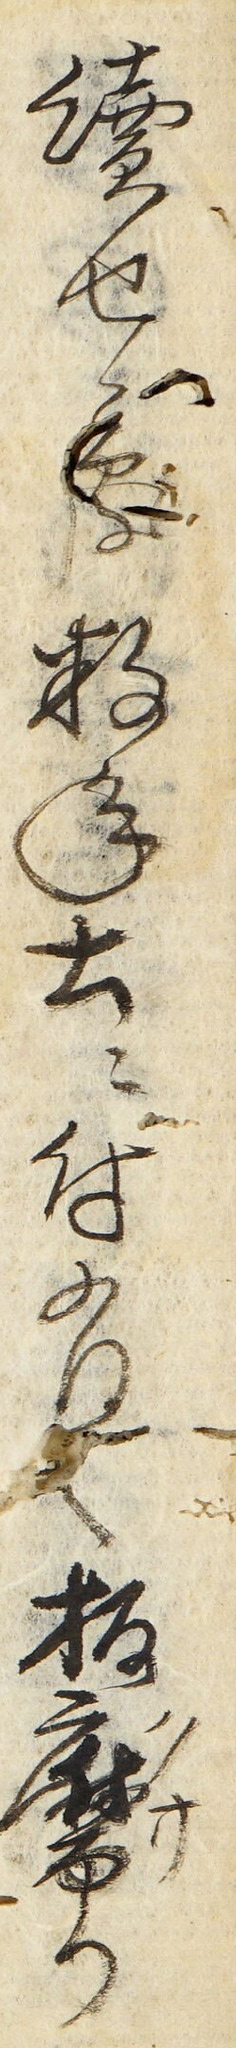読せ候処数年土ニ付有之板腐り
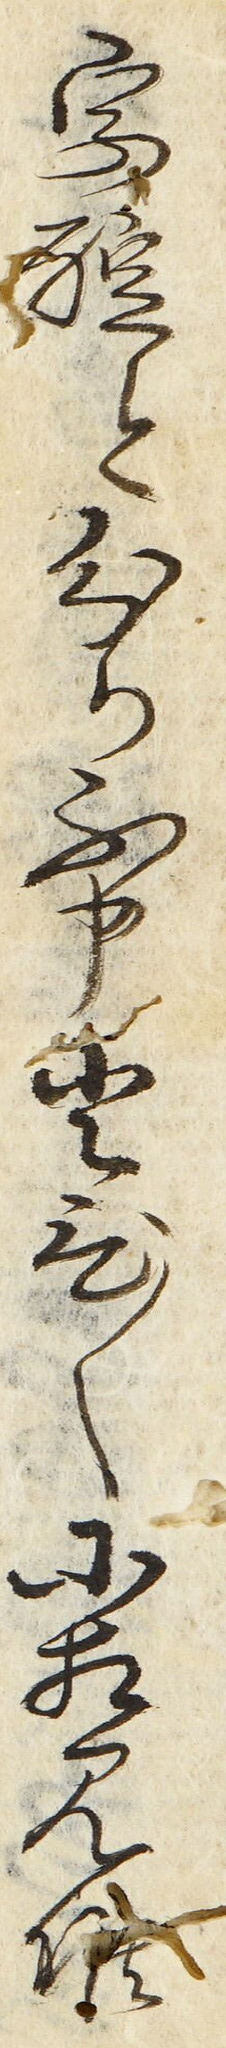字聢と分り不申とひ〳〵に相見候
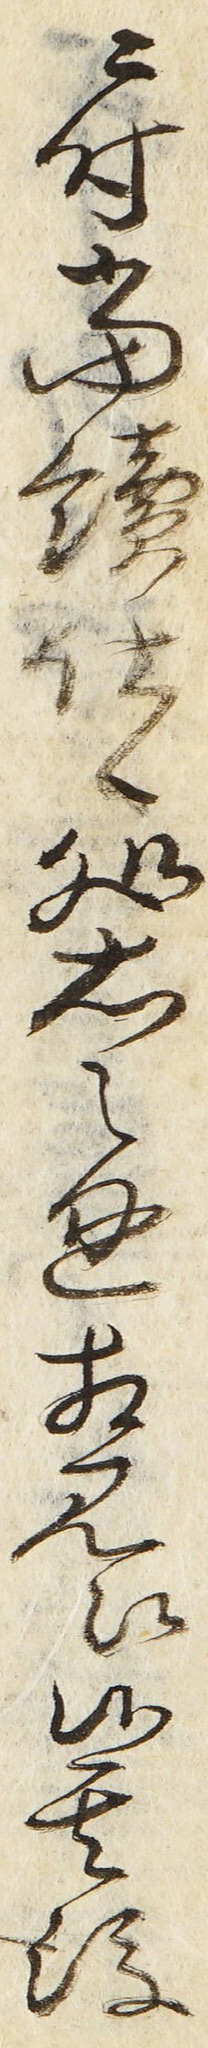ニ付当読仕候処右之通相見江候其後
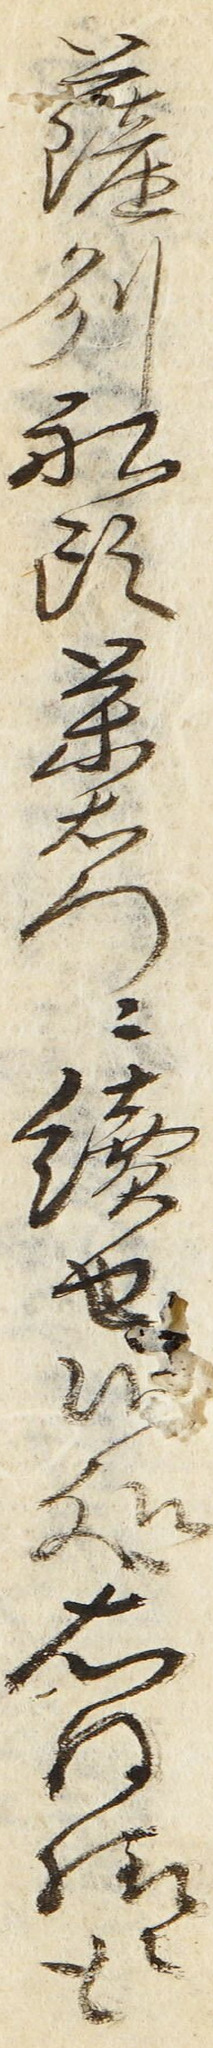薩州船頭栄右衛門ニ読せ候処右同様ニも
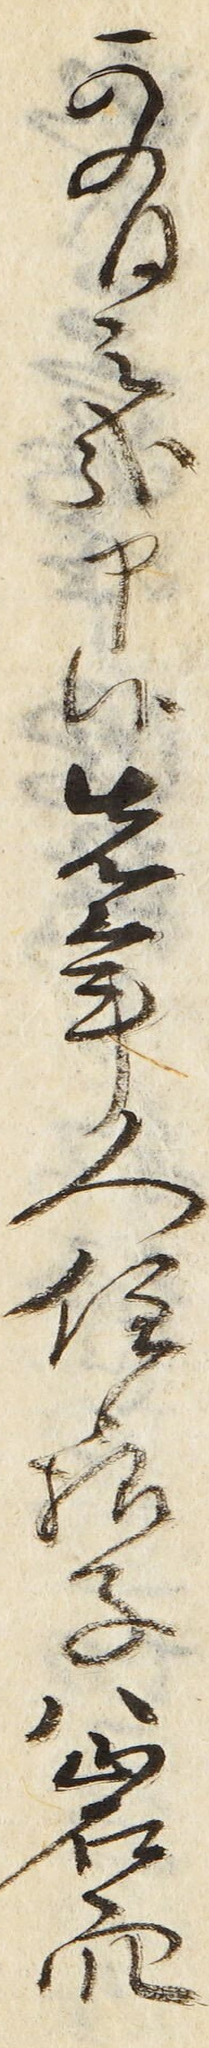可有之哉申候先年人住候様子ハ岩穴
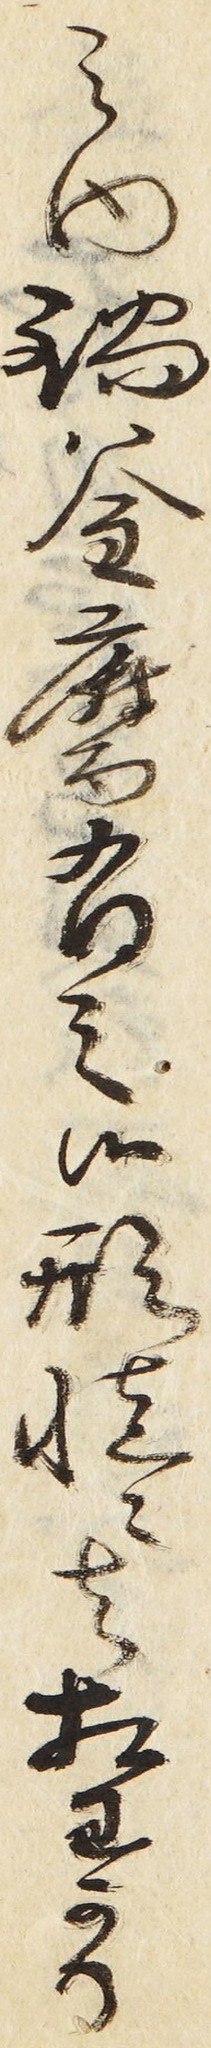之内鍋釜腐有之候形慥ニ者相わかり
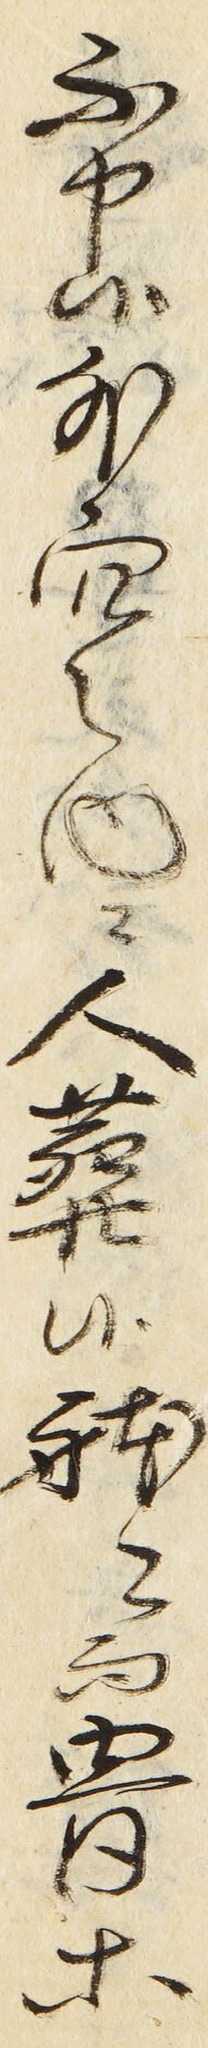不申候外穴之内ニ人葬候体ニ而骨等
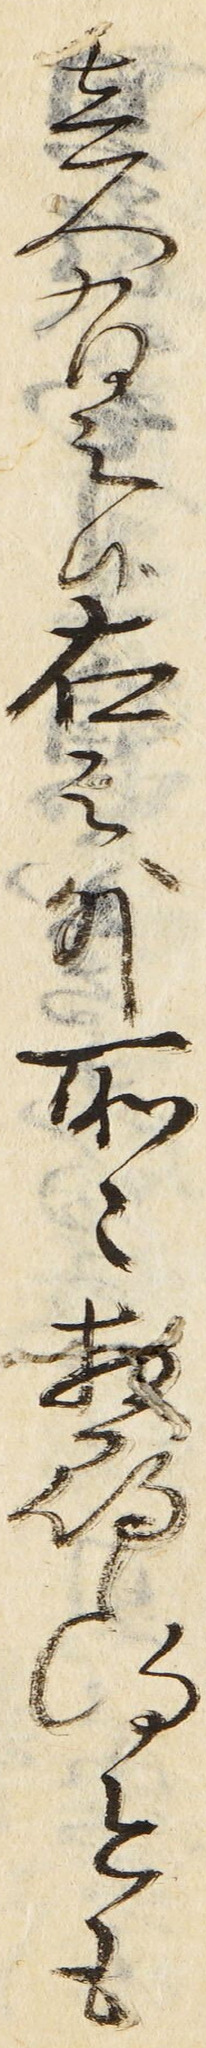壱人有之候右之外所々相尋候得とも
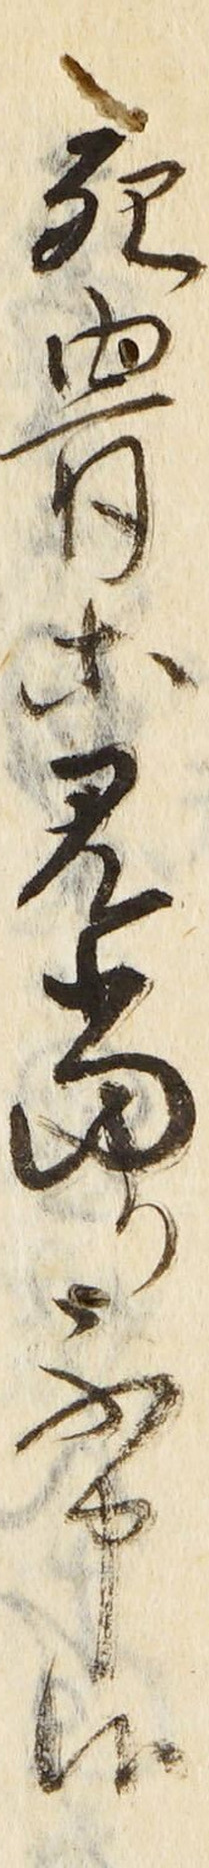死骨等見当り不申候
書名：漂流一件上書
